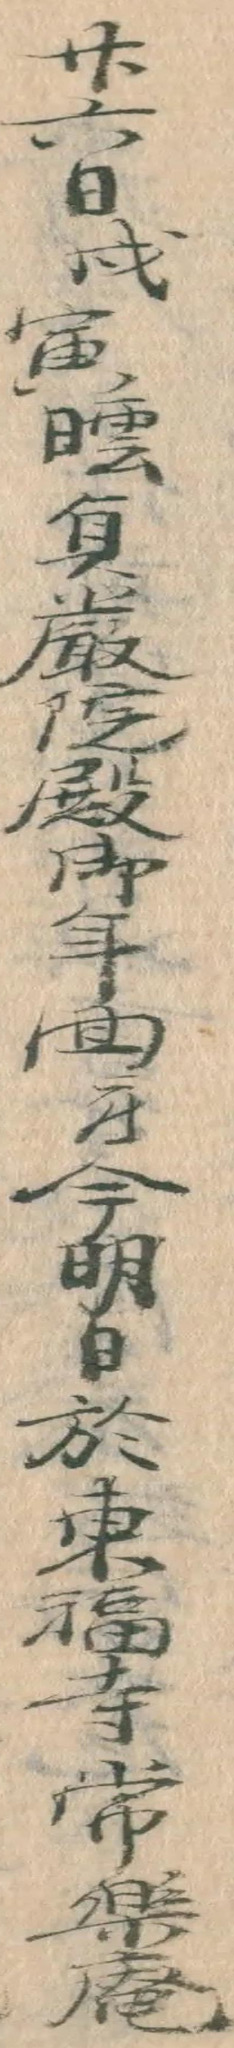廿六日戊寅曇貞厳院殿御年回ニ付今明日於東福寺常楽庵
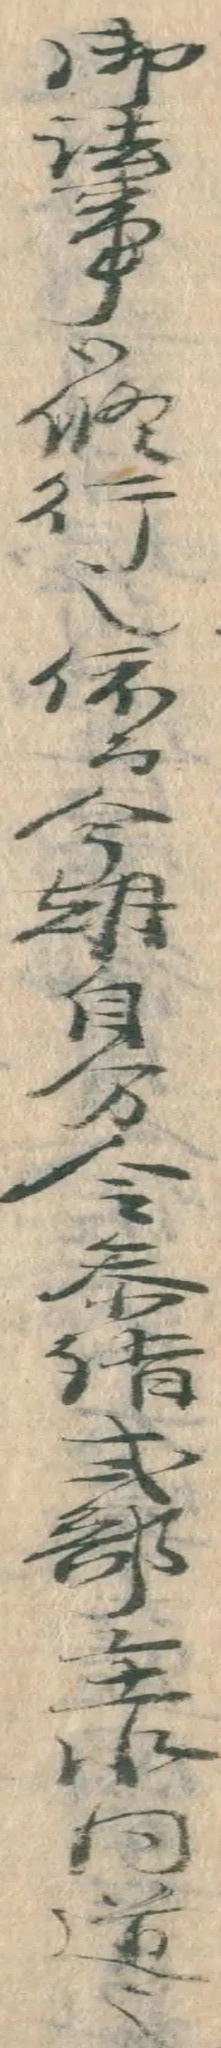御法事御修行也依而今朝自分令参詣式部主水同道也
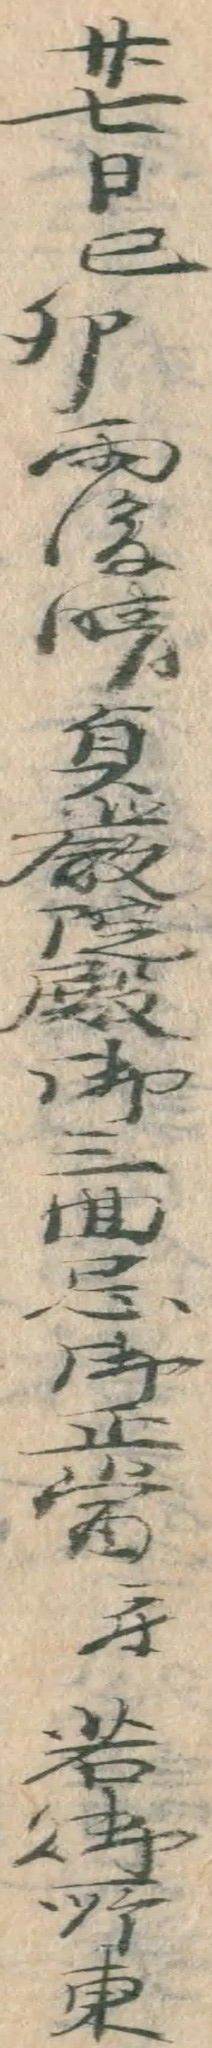廿七日己卯雨後晴貞厳院殿御三回忌御正當ニ付若御所東
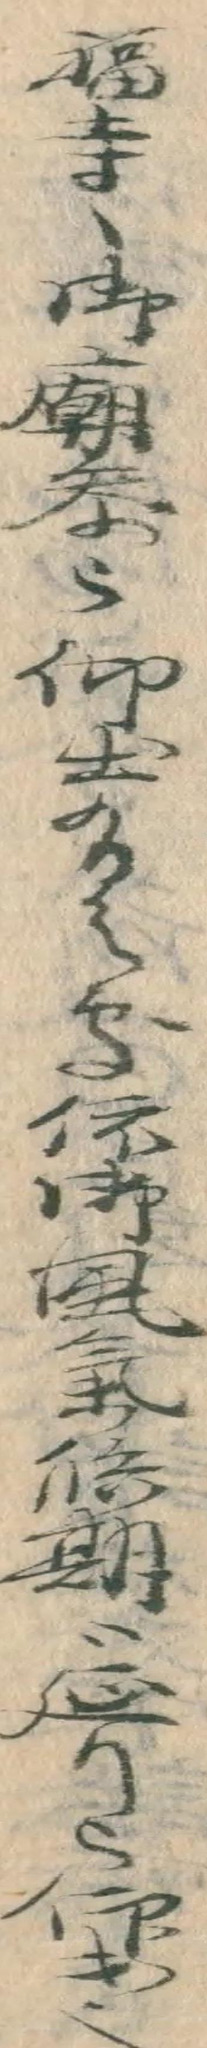福寺へ御廟参被仰出有之處依御風氣臨期御延引被仰義也
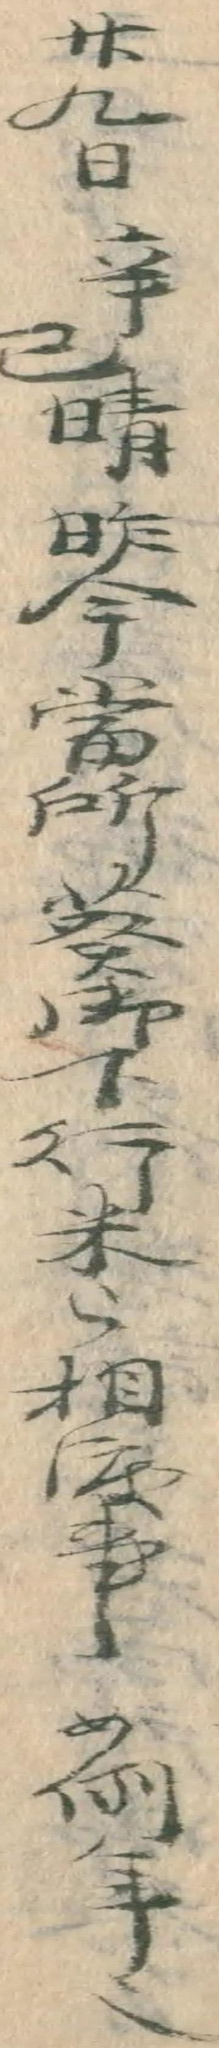廿九日辛巳晴昨今當所葵御下行米被相渡事如例年也

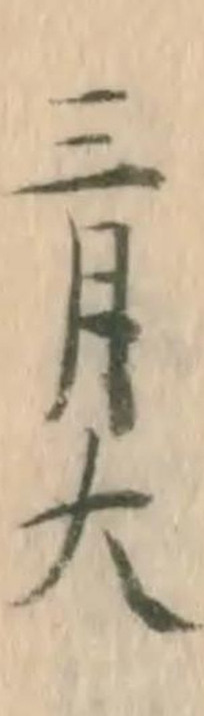三月大
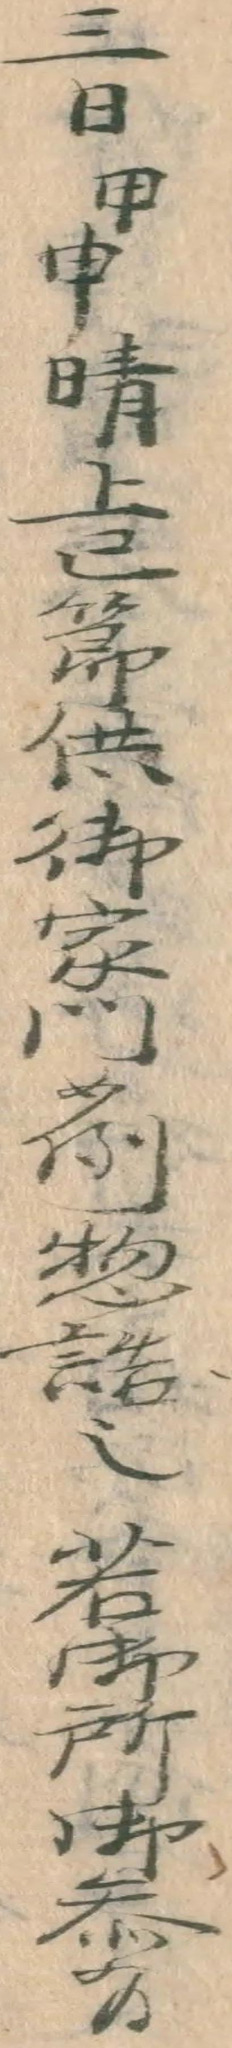三日甲申晴上巳節供御家門如例惣詰也若御所御参有
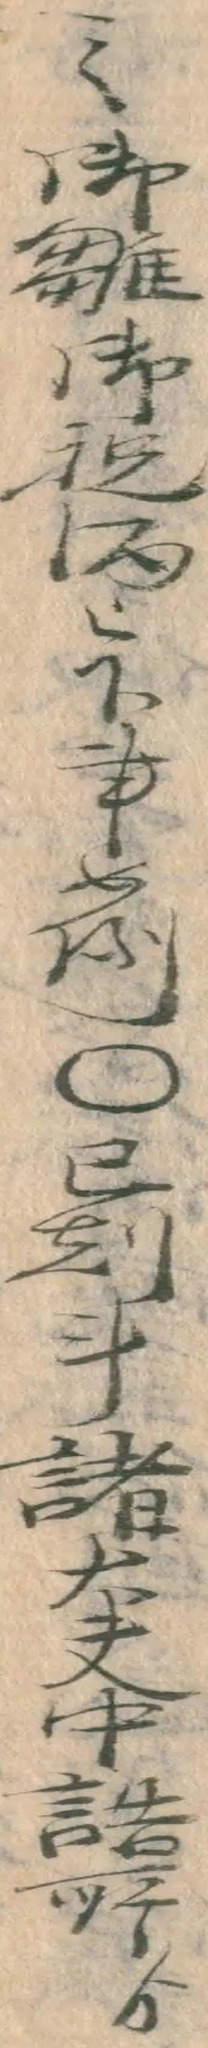之御雛御祝酒被下事如例〇巳刻斗諸大夫中詰所ゟ
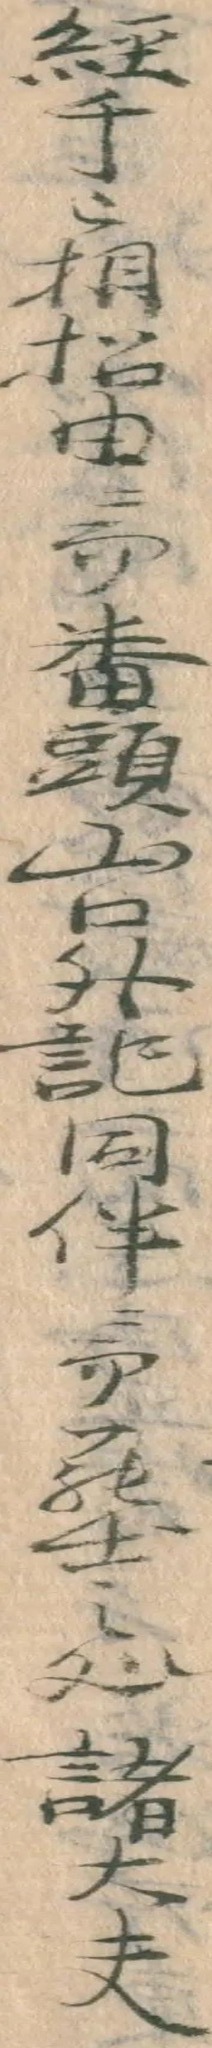経千被相招由ニ而番頭山口外記同伴ニ而罷出之処諸大夫
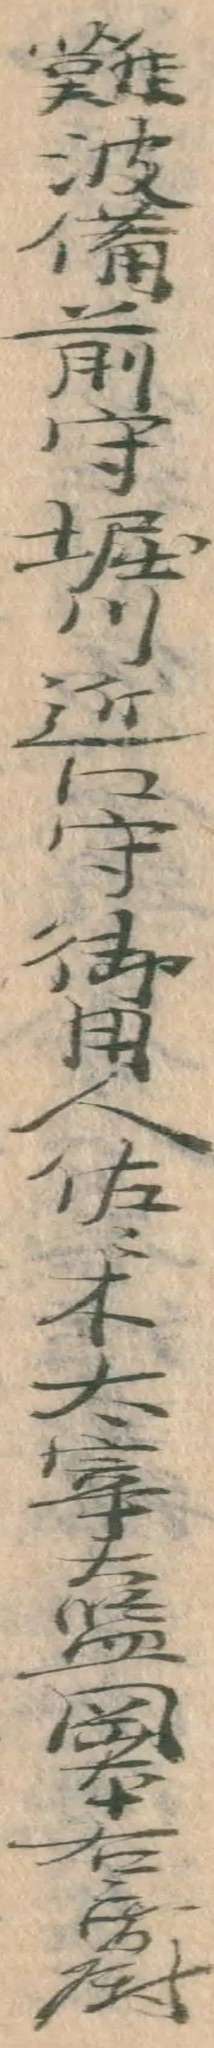難波備前守堀川近江守御用人佐々木大宰大監岡本右衛門尉
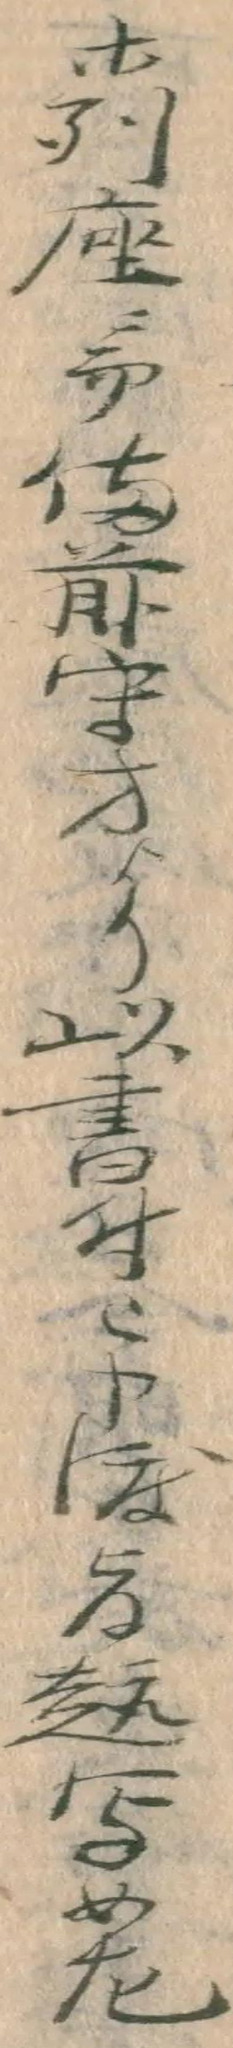等列座ニ而備前守方より以書付被申渡旨趣写如左
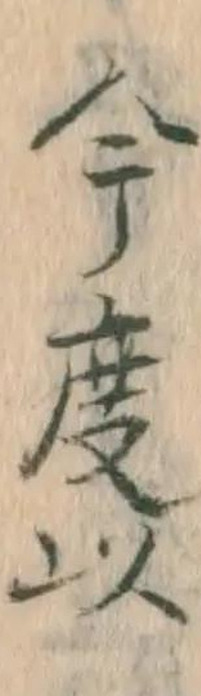今度以
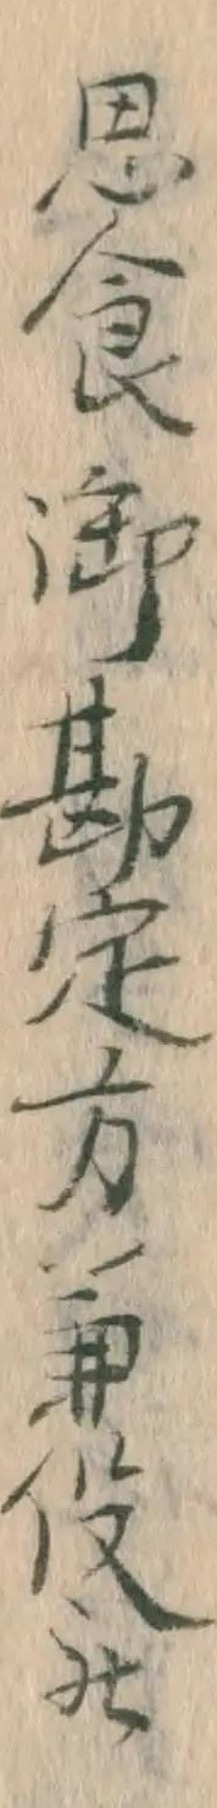思食御勘定方兼役被
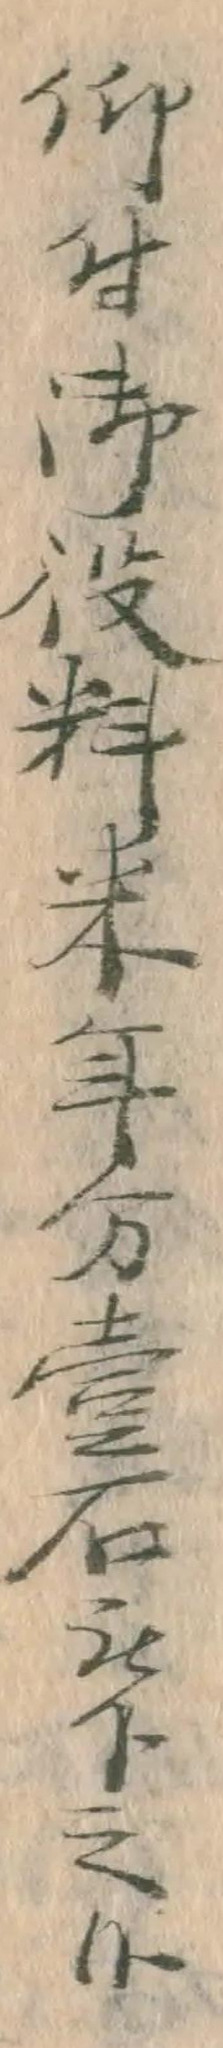仰付御役料米年分壱石被下之候
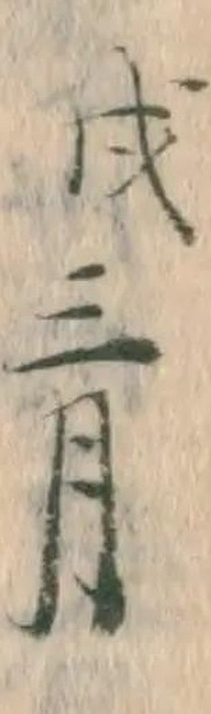戌三月
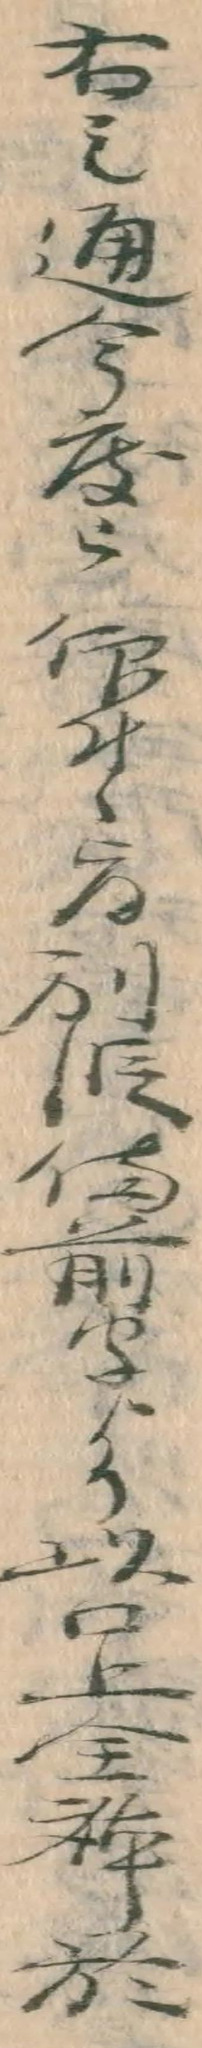右之通今度被仰付候旨別段備前守より以口上全躰於
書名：賀茂社記録. 第65冊
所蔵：国立国会図書館 National Diet Library, JAPAN
